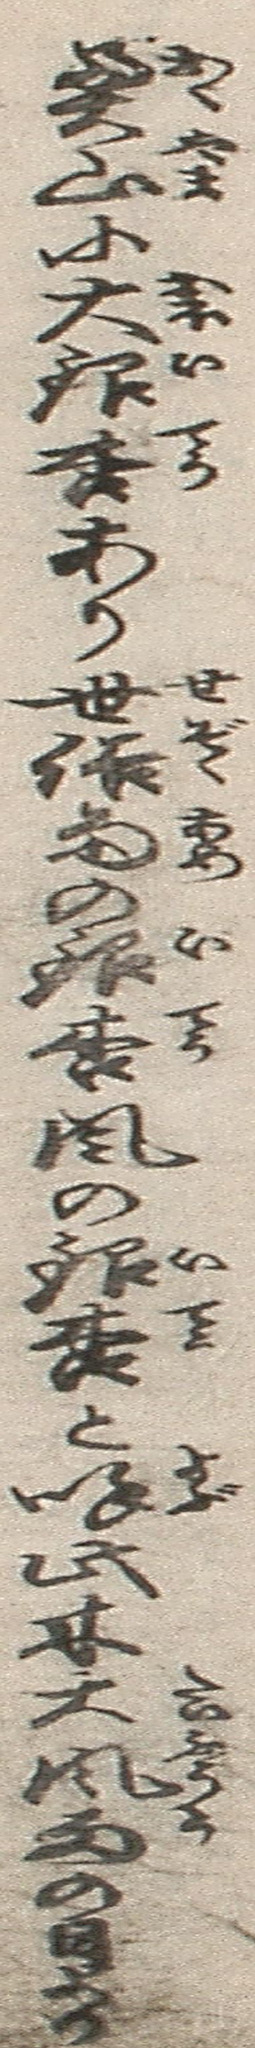奥山に大銀杏あり世俗雨の銀杏風の銀杏と呼此木大風雨の日より
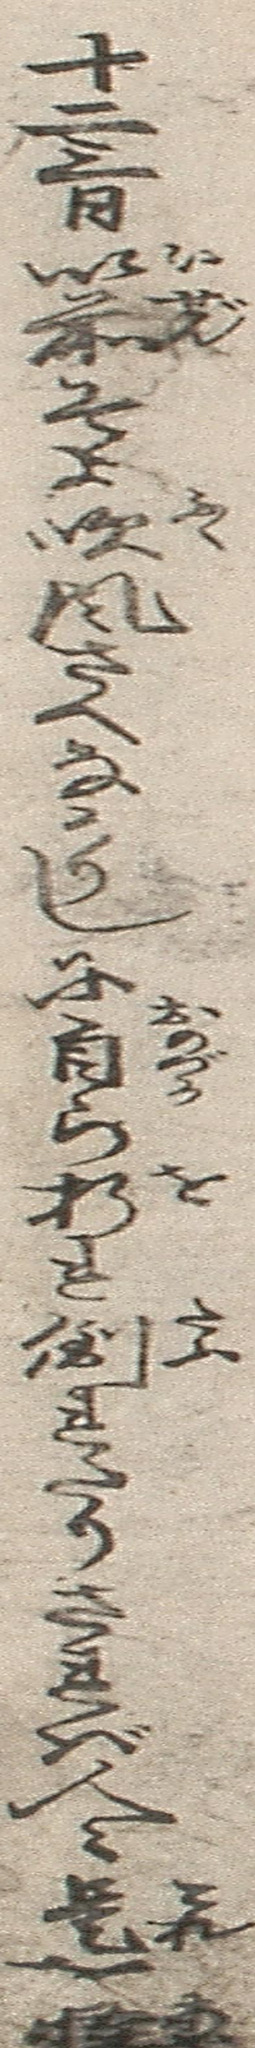十二三日以前そよ吹風さへなかりしに自ら折れ倒れたりされバ人々是を怪
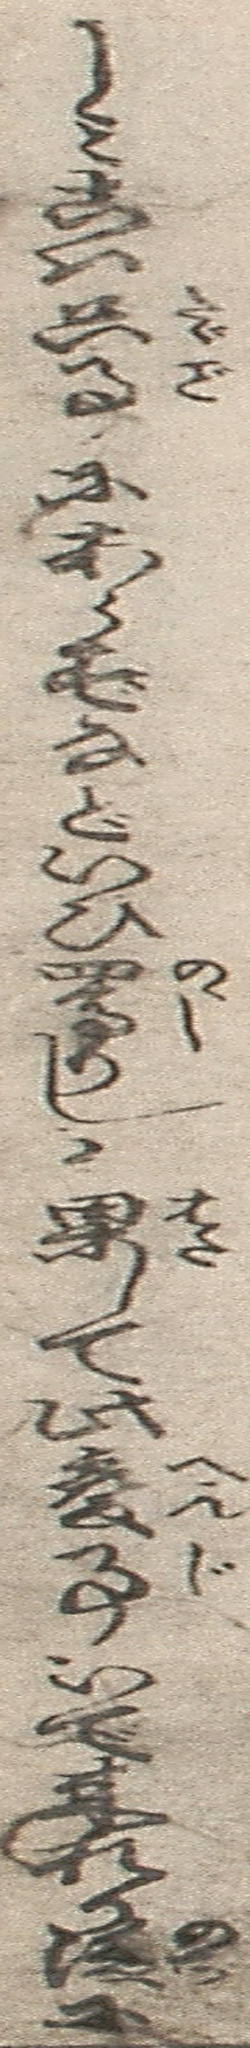しミこハ只事にあらずなどいひ罵りしか果して此変事いて来れり後に

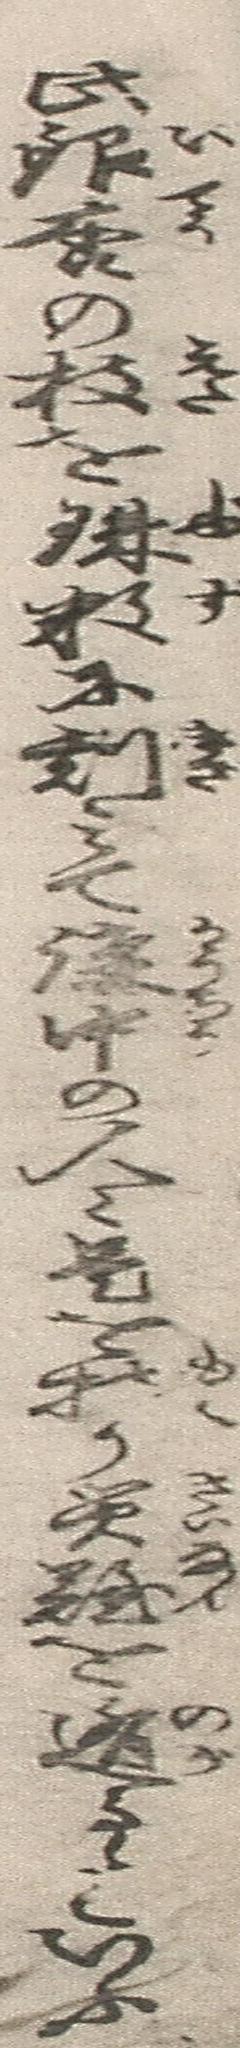此銀杏の枝を珠数に刻ミて懐中の人々是を持り災難を遁るゝといふ
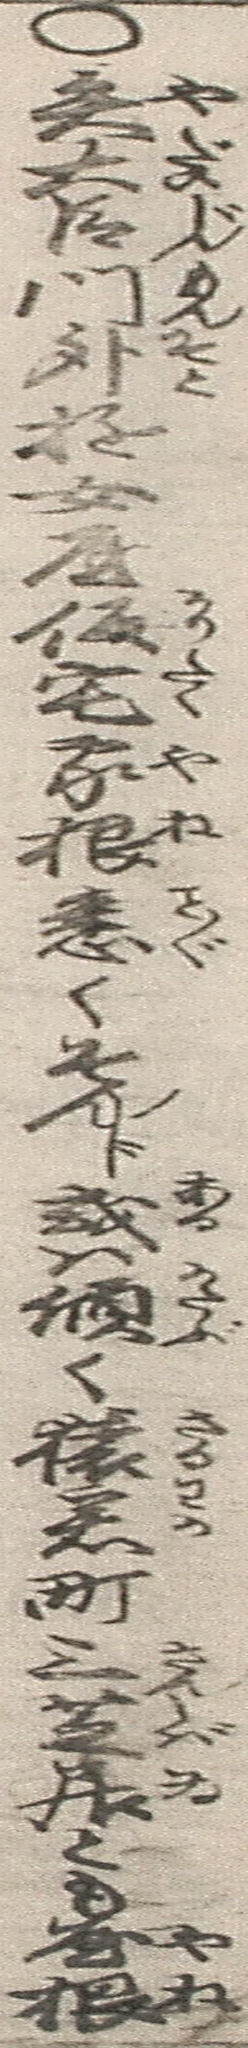◯矢大臣門外遊女屋仮宅屋根悉くそんじ或ハ傾く猿若町三芝居とも屋根
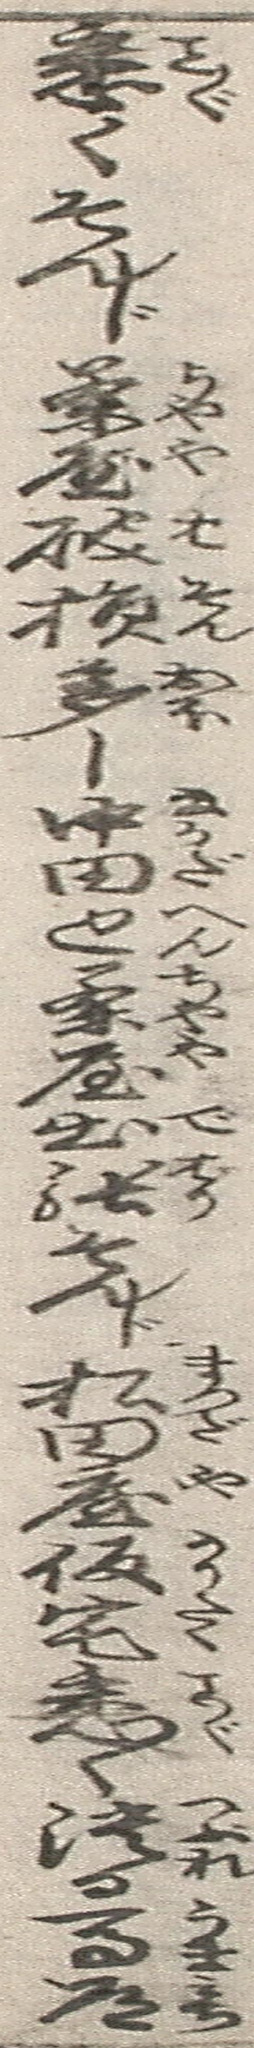悉くそんじ茶屋破損多し中田辺茶屋出張そんじ松田屋仮宅悉く潰る馬道
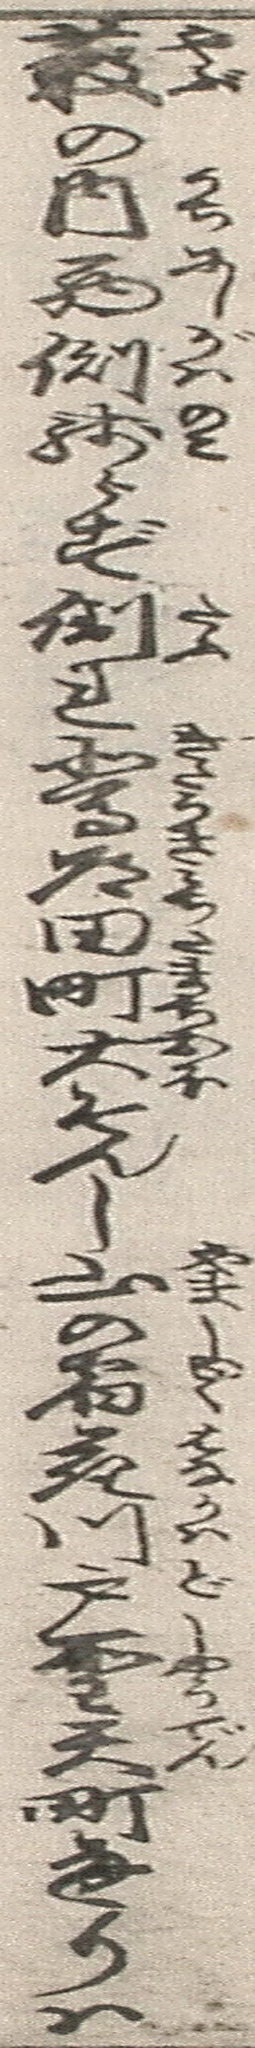藪の内西側残らず倒れ北馬道田町大そんし山の宿花川戸聖天町通りハ
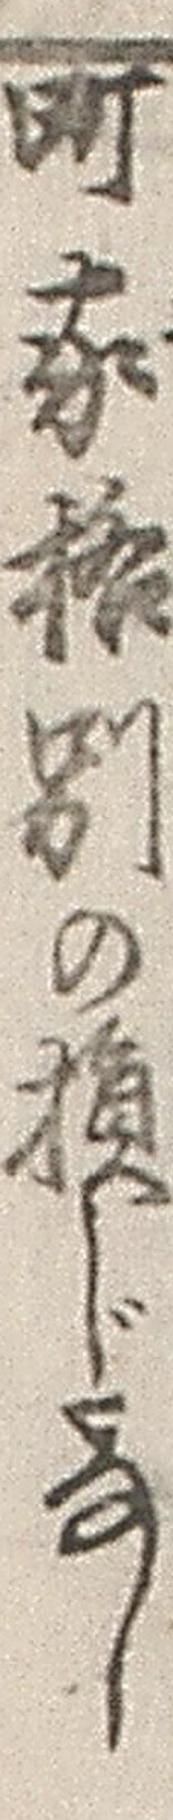町家格別の損じなし
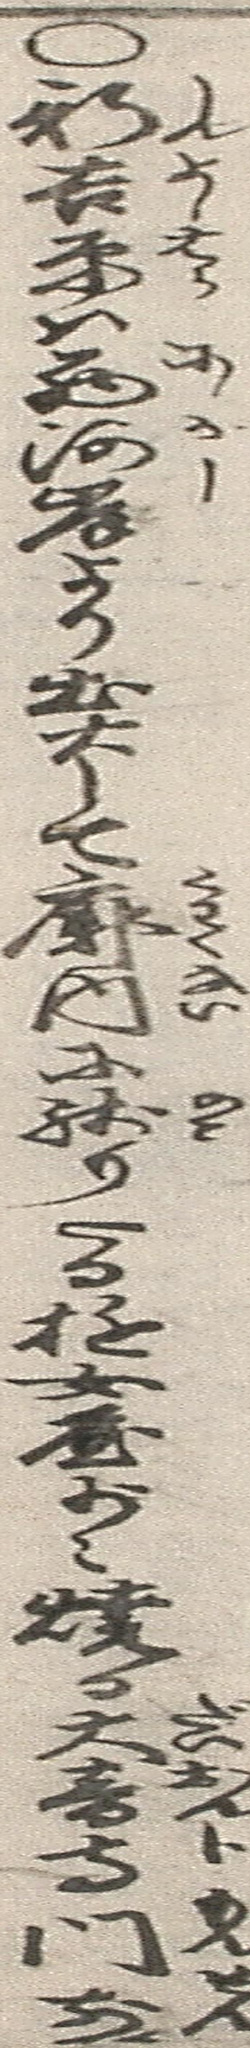◯新吉原ハ西河岸より出火して廓内に残りける遊女屋少々焼る大音寺門前
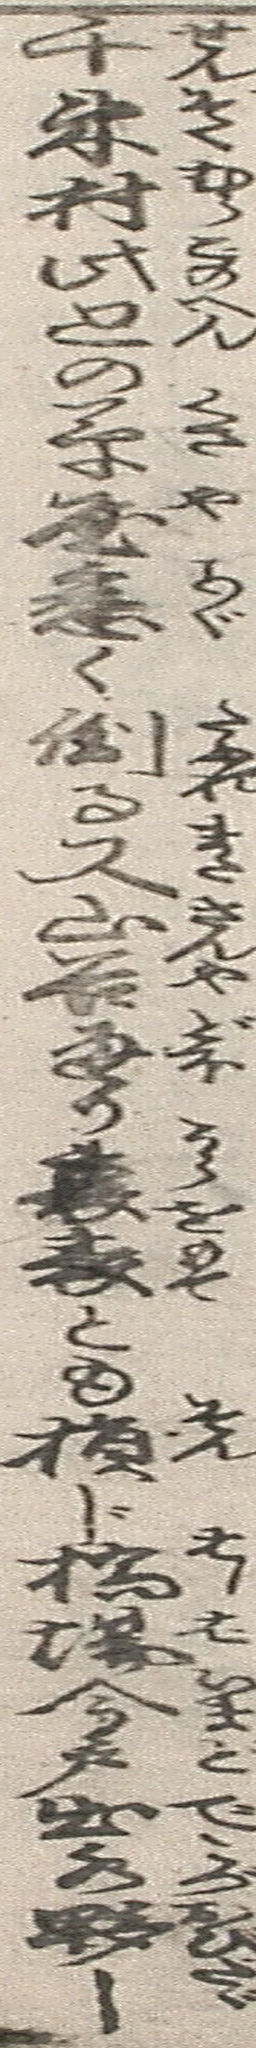千束村此辺の草屋悉く倒る又山谷通り裏表とも損じ橋場今戸出水夥し
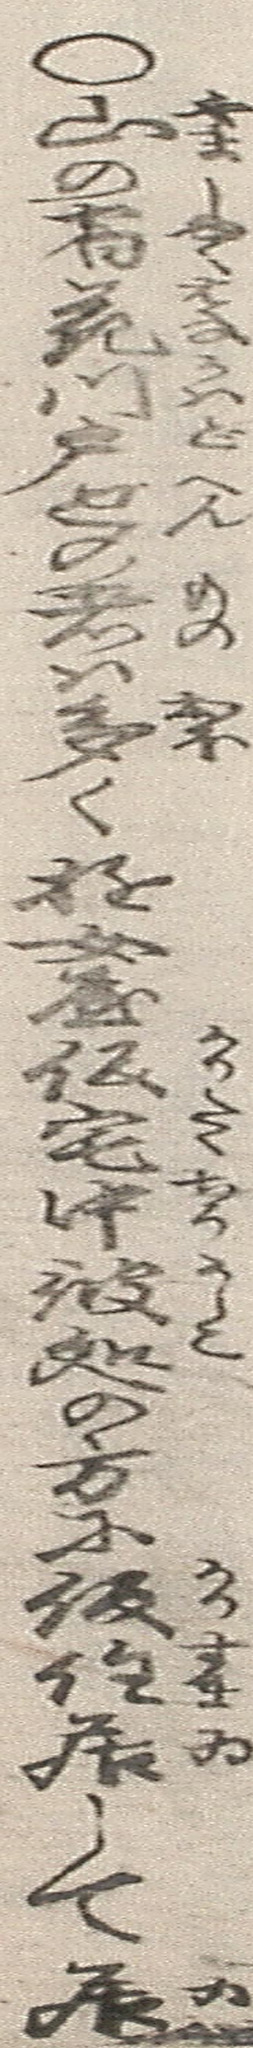◯山の宿花川戸辺の者ハ多く遊女屋仮宅中彼処の方に仮住居して居
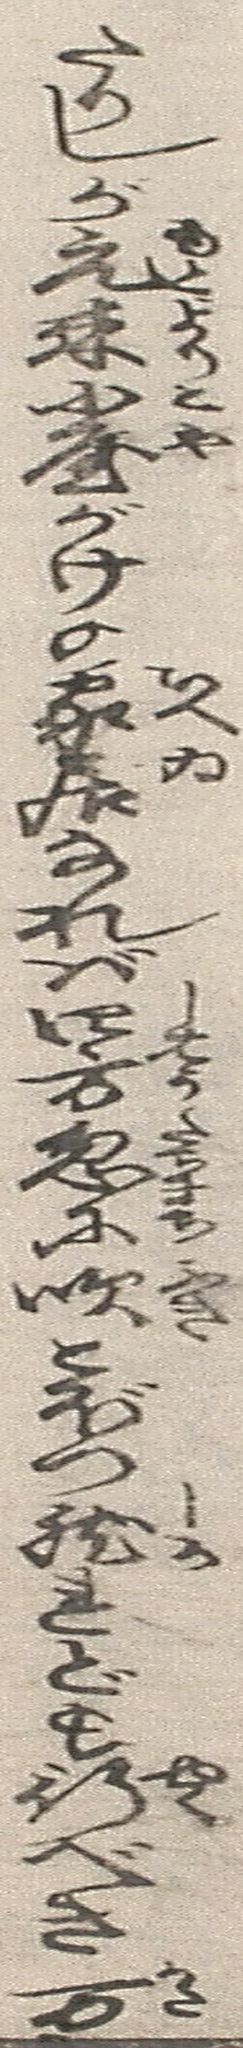たりしが元来小屋がけの家居なれバ四方忽に吹こぼつ然れども行べき方
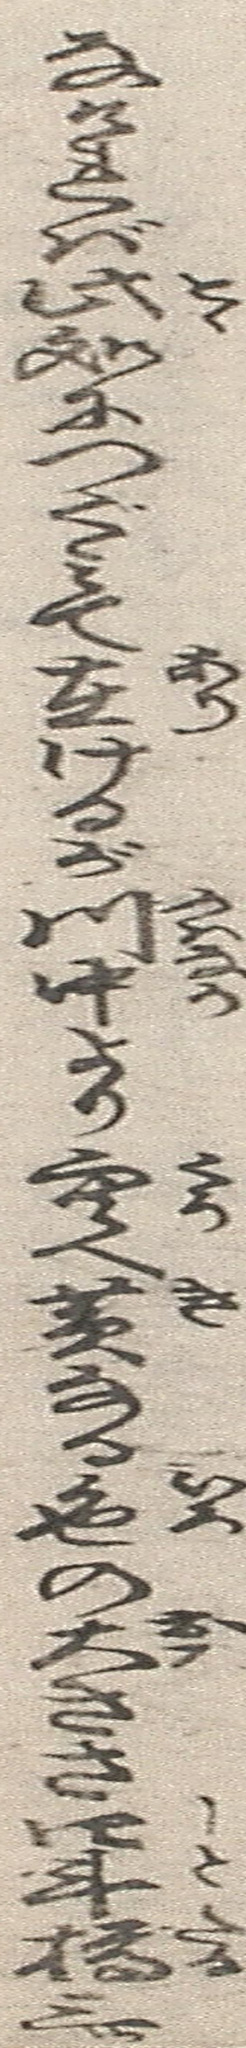なけれバ此処につぐミて在けるが川中より空へ黄なる色の大きさ四斗樽三ッ
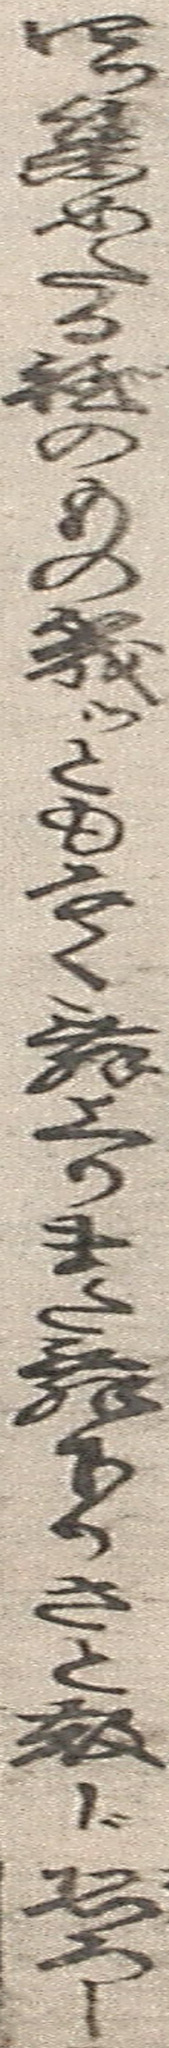四ッ集めたる程のもの幾ッともなく舞上りまた舞下りさと散じ恐ろし
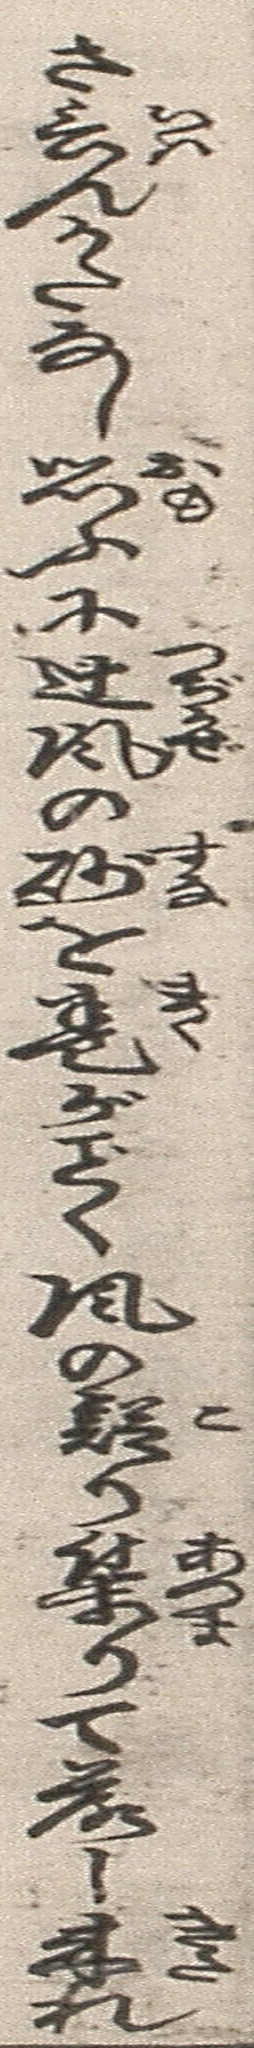さ言んかたなし思ふに辻風の砂を巻がごとく風の疑り集りて落し来れ
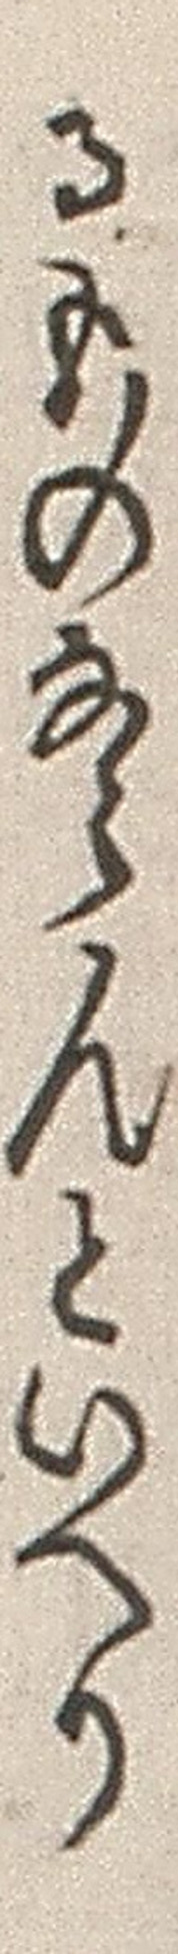るものならんといへり
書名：安政風聞集　上中下　全
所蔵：東京大学地震研究所図書室 Earthquake Research Institute Library, The University of Tokyo, JAPAN
